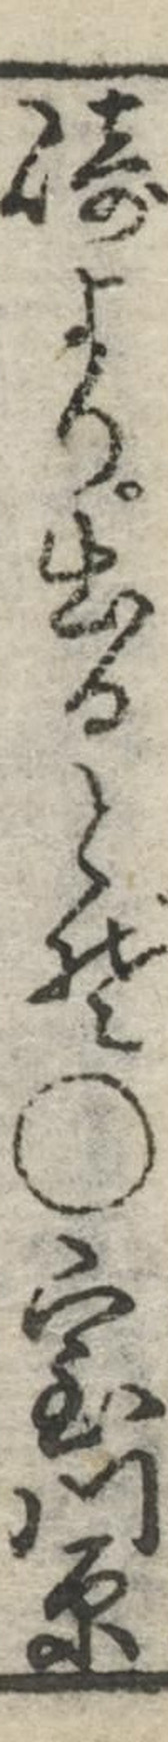崎より。出るとぞ〇室川原
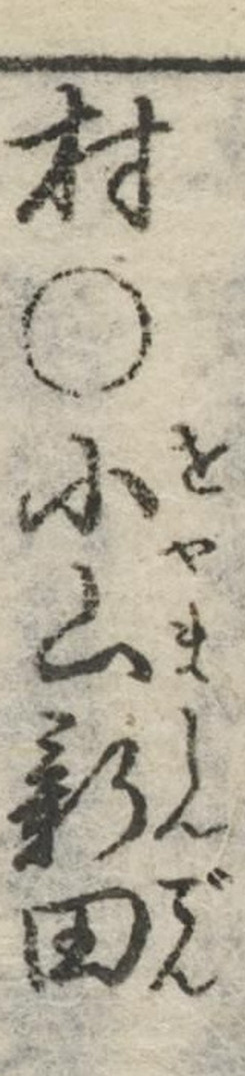村〇小山新田

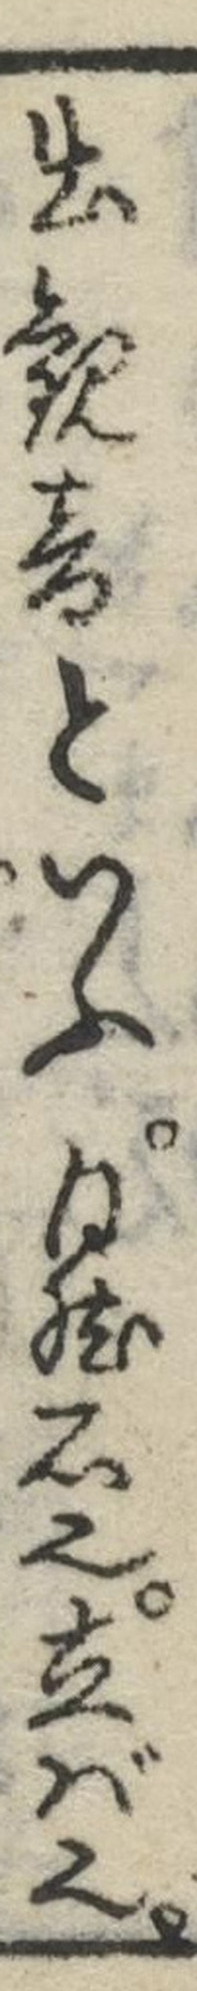出観音といふ。自然石也。立ば也。
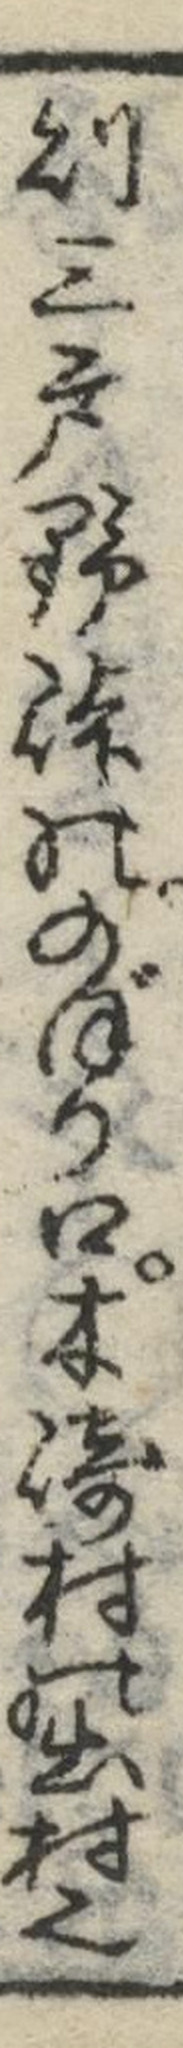則三戸野峠ののぼり口。木崎村の出村也
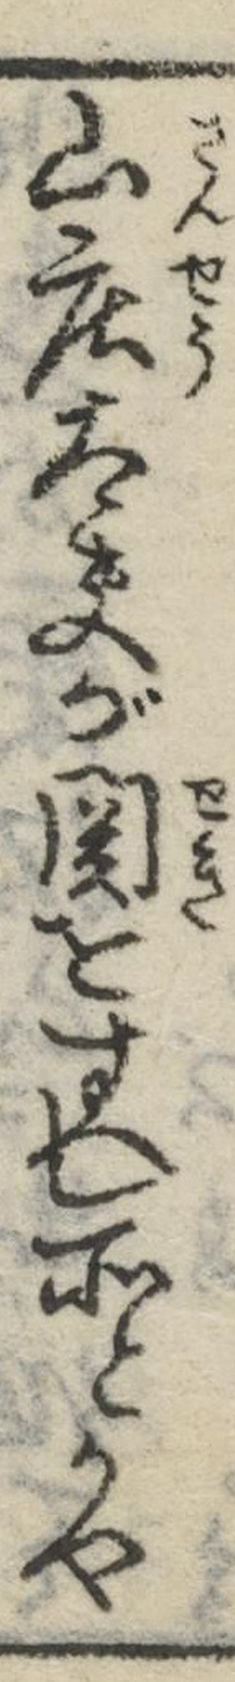山庄太夫が関をすへし所とかや
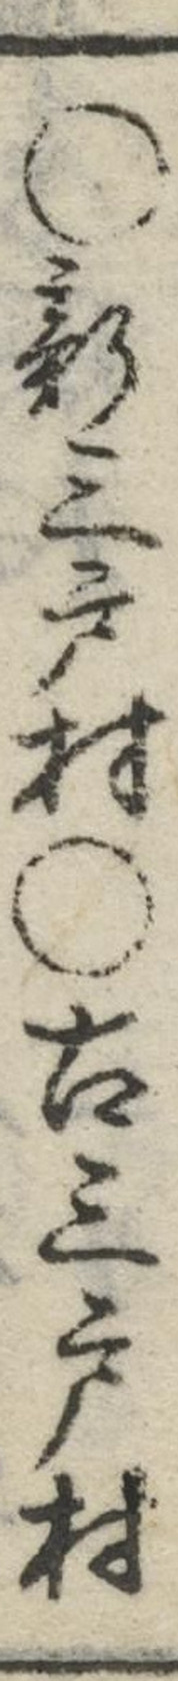○新三戸村○古三戸村
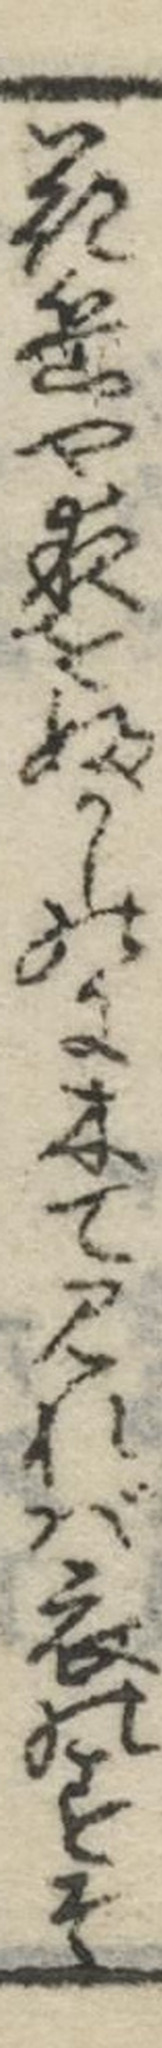花岳や夜をふかしのに木て見れば衣のすそ
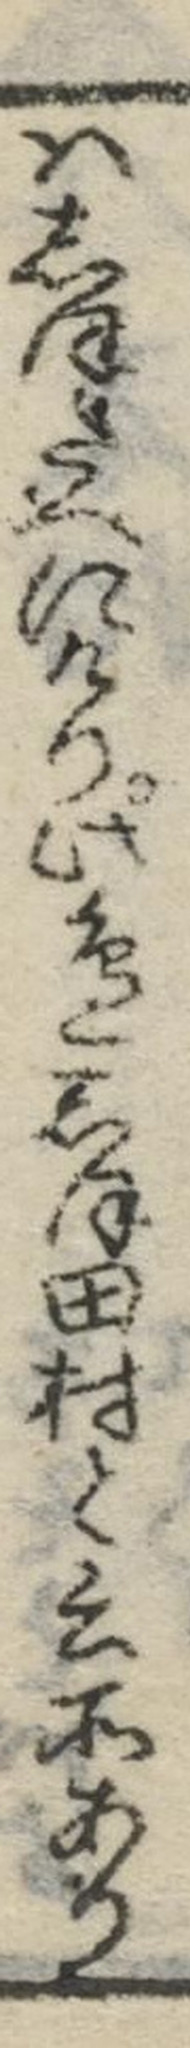はしほたへにけり。此辺しほ田村と云所あり
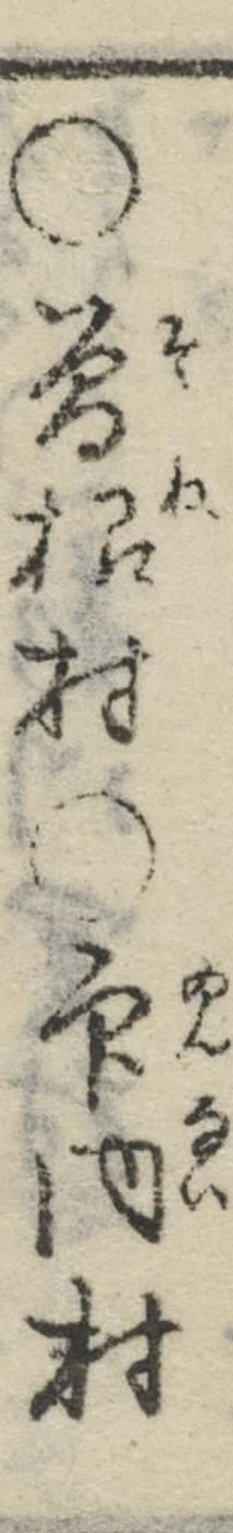○曽根村○印内村
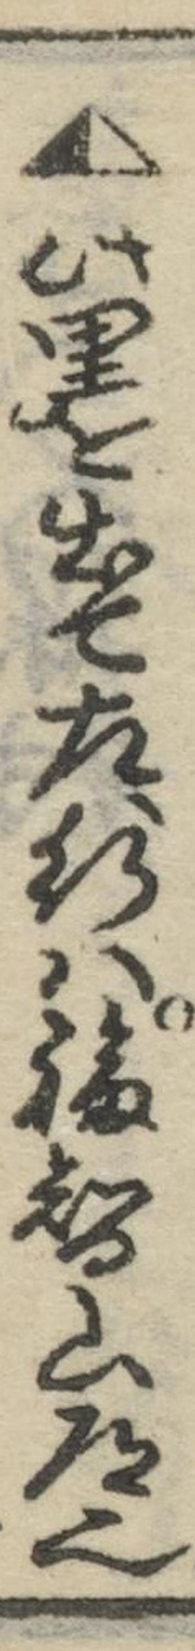▲此里を出て左へ行は。福智山道也。
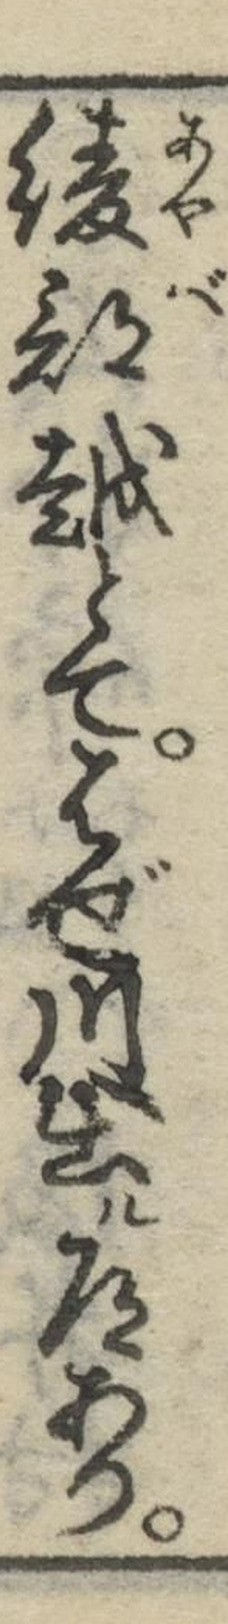綾部越とて。はぜ川へ出る道あり。
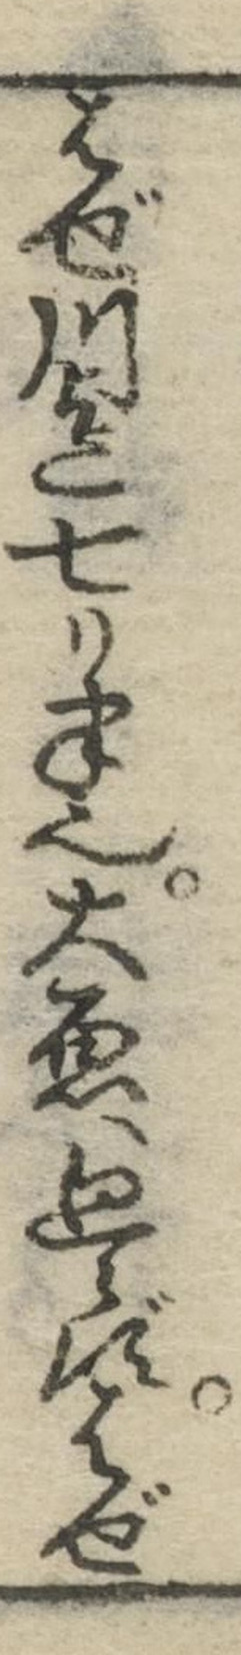はゼ川迄七り半也。大原へ廻らずはぜ
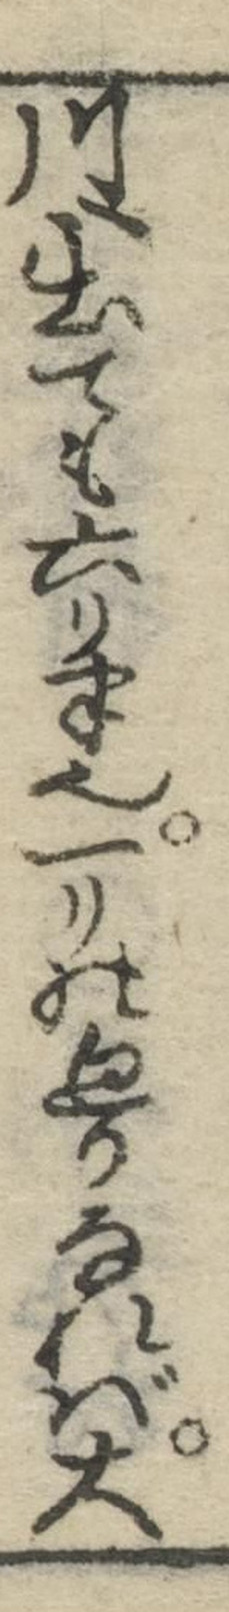川へ出ても六り半也。一りの廻りなれば。大
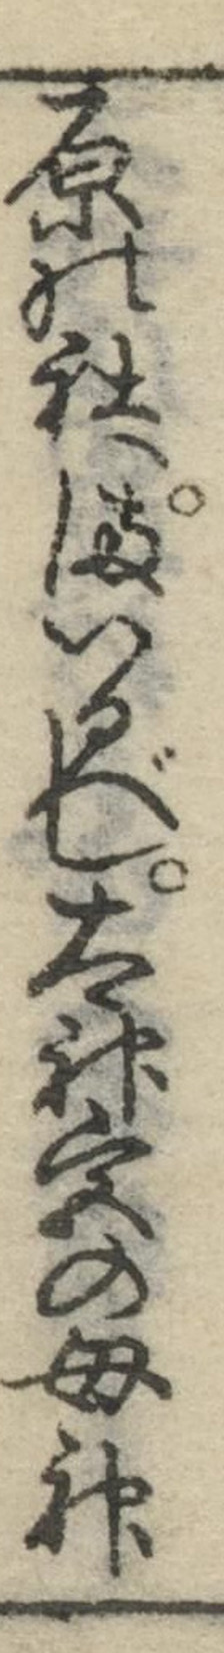原の社へ。まいるべし。大神宮の母神
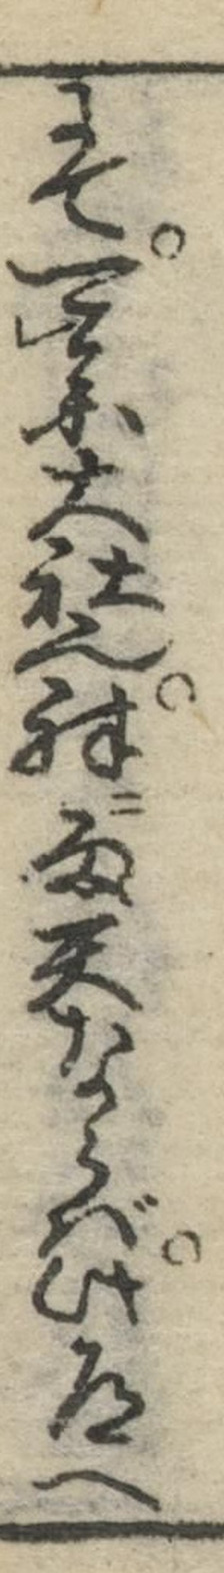にて。可参大社也。殊二雨天ならば。此道へ

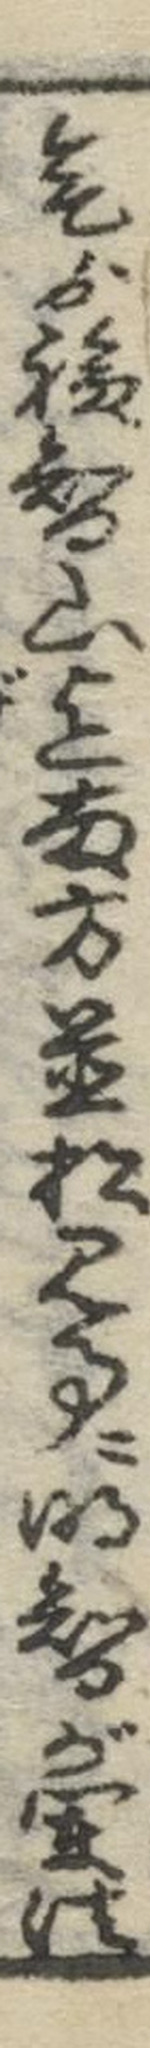是ゟ福智山迄両方並松見事に明智が軍法
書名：但州城崎浴湯辧
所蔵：東京大学地震研究所図書室 Earthquake Research Institute Library, The University of Tokyo, JAPAN
